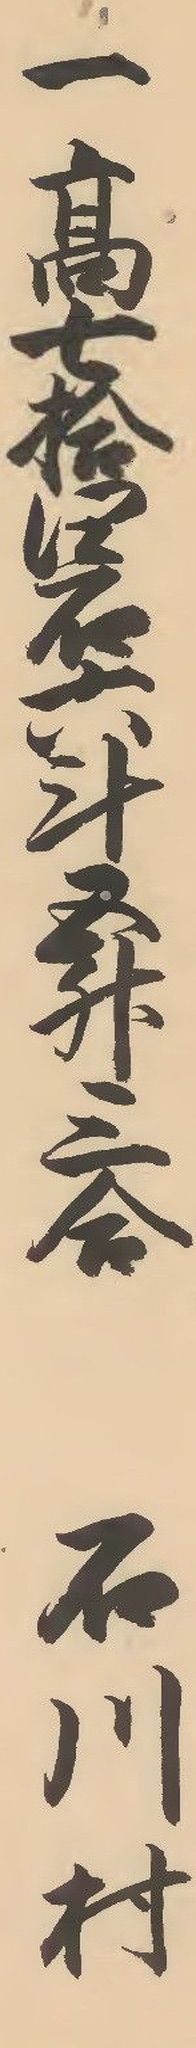一高七拾四石六斗五升三合石川村
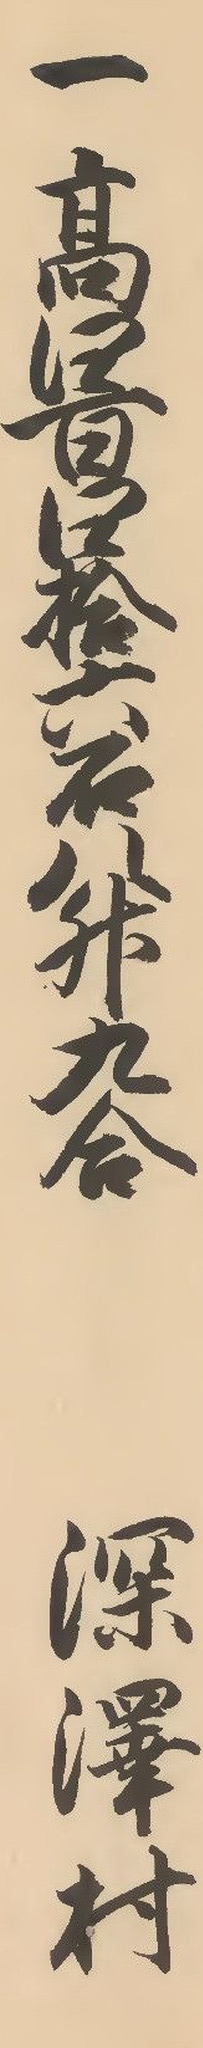一高四百四拾六石八升九合深澤村
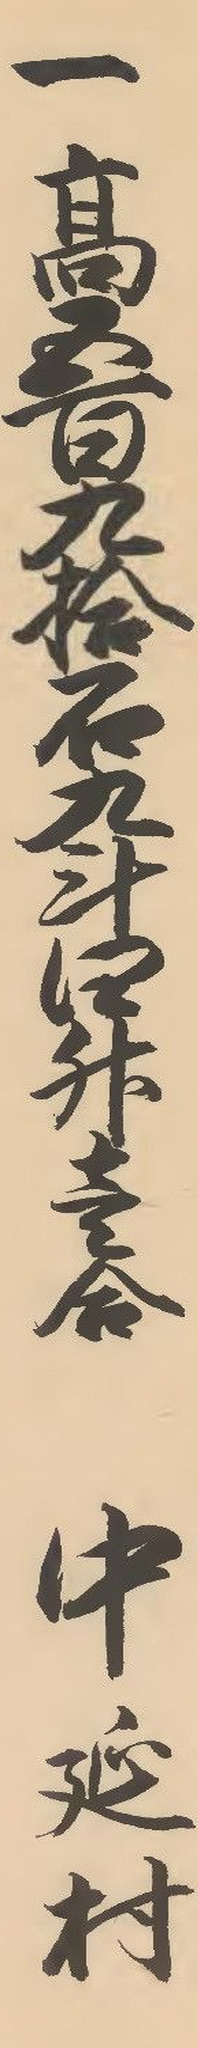一高五百九拾石九斗四升壱合中延村
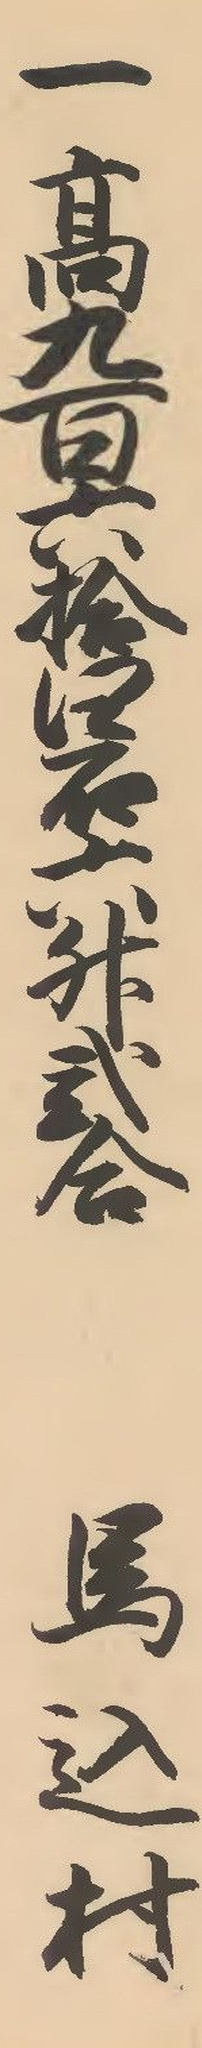一高九百六拾四石六升弐合馬込村
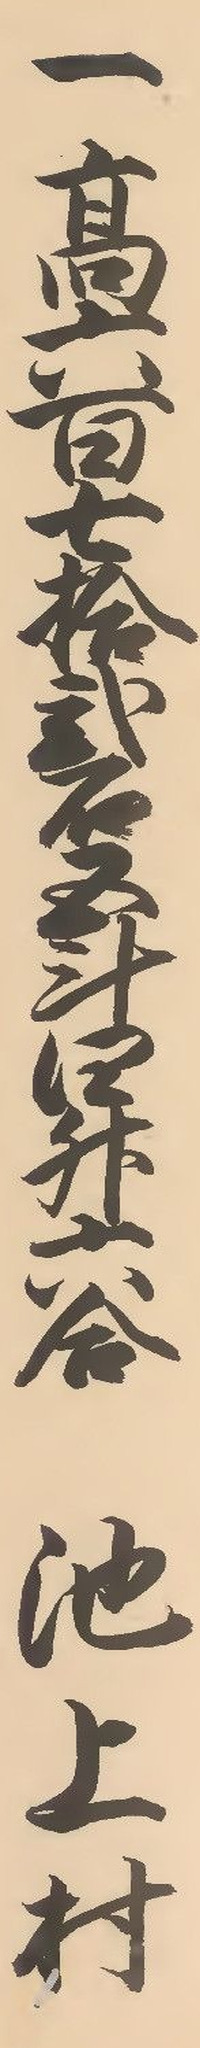一高六百七拾弐石五斗四升六合池上村
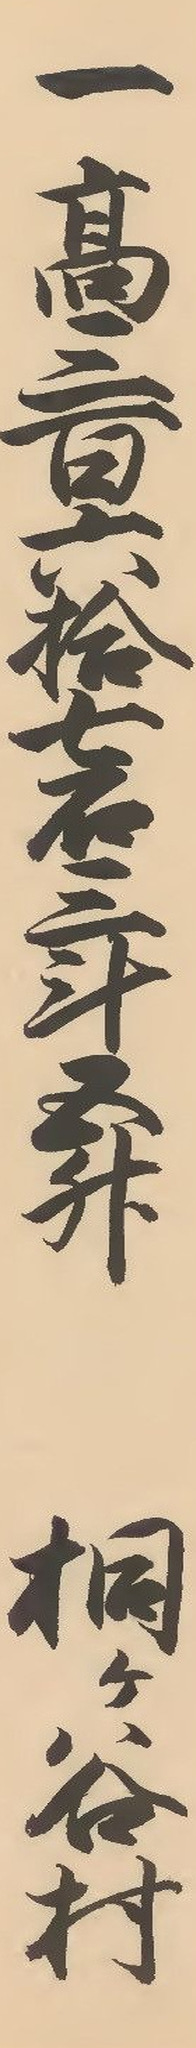一高三百六拾七石三斗五升桐ヶ谷村
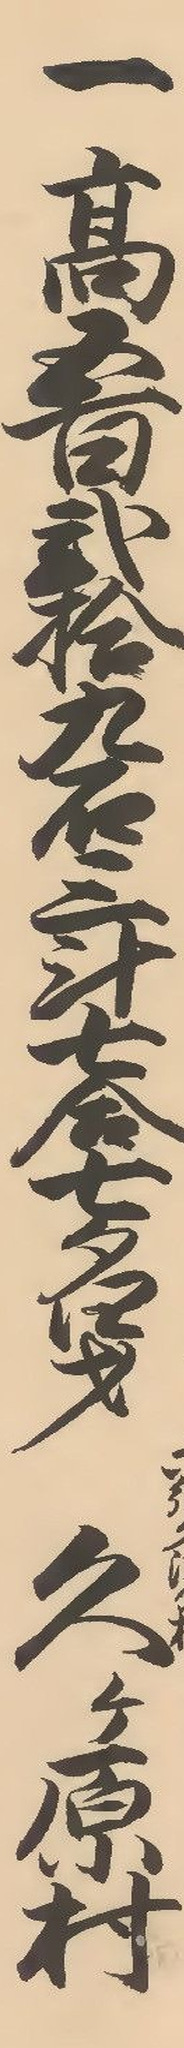一高五百弐拾九石三斗七合七勺四才久ヶ原村
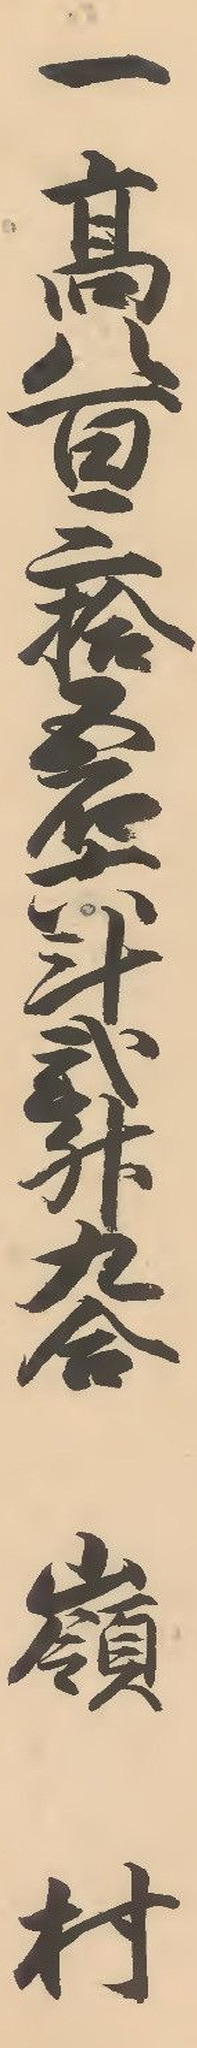一高八百三拾五石六斗弐升九合嶺村

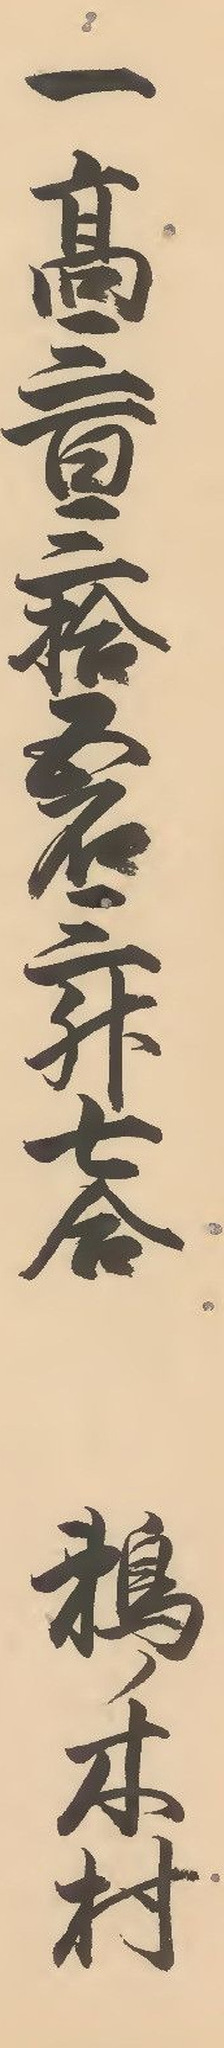一高三百三拾五石三升七合鵜ノ木村
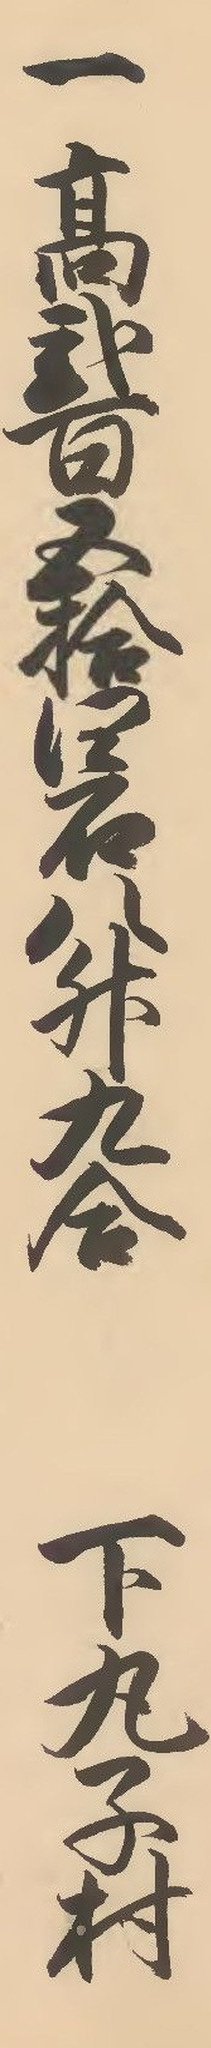一高弐百五拾四石八升九合下丸子村
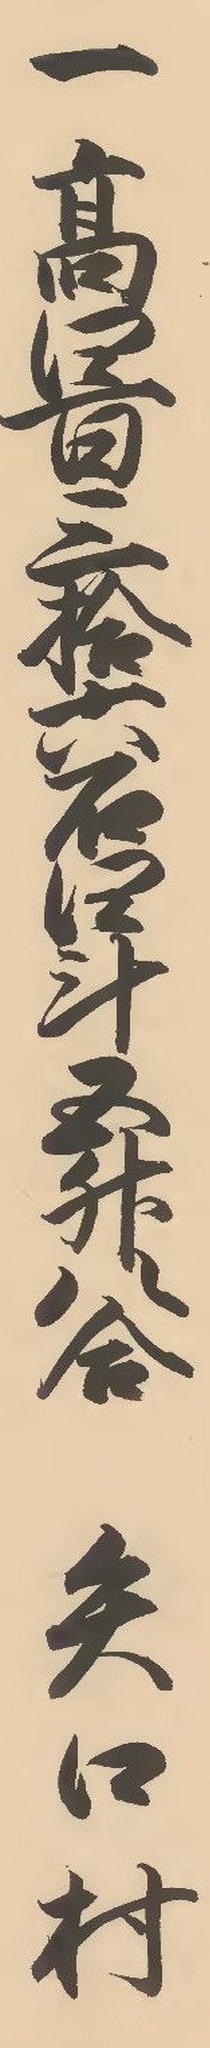一高四百三拾六石四斗五升八合矢口村
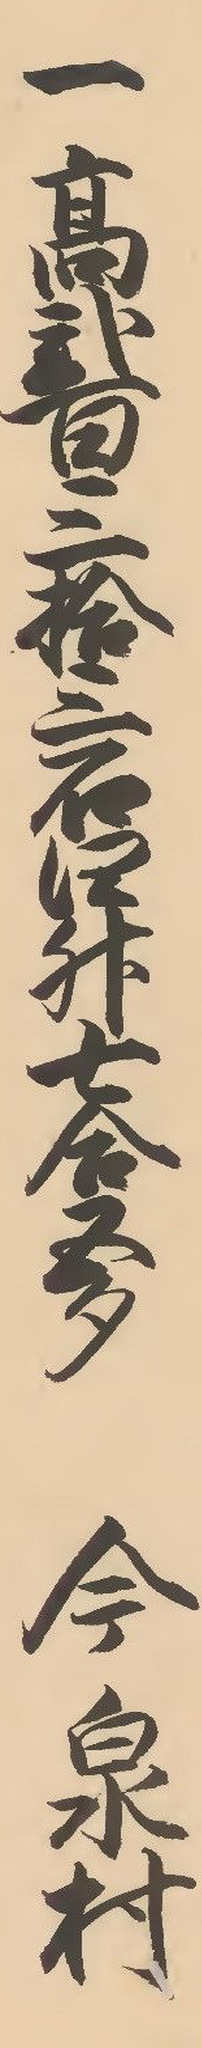一高弐百三拾三石四升七合五勺今泉村
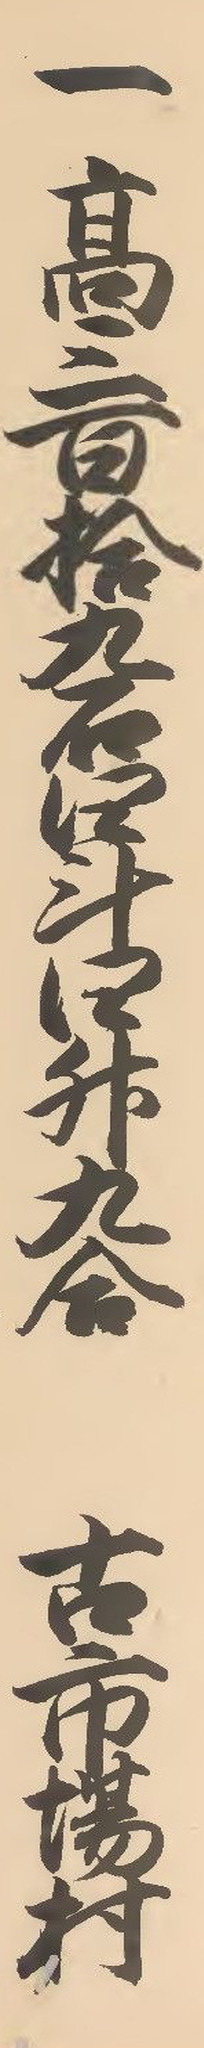一高三百拾九石四斗四升九合古市場村
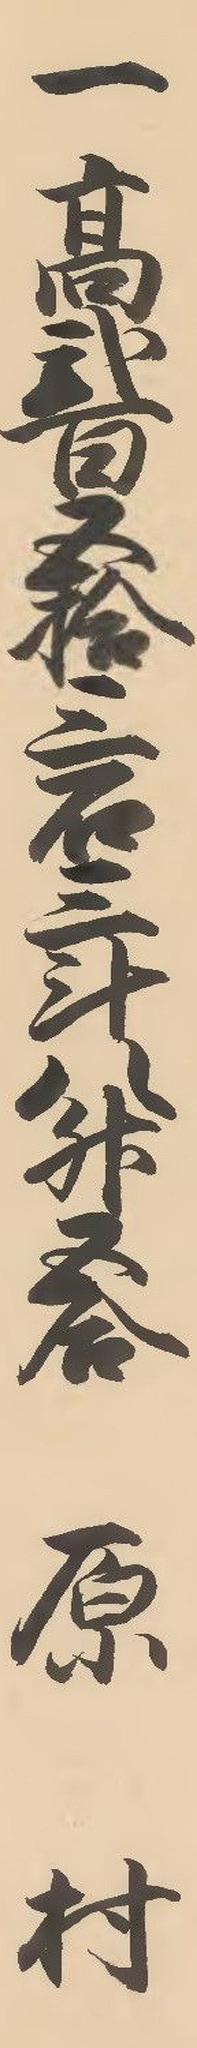一高弐百五拾三石三斗八升五合原村
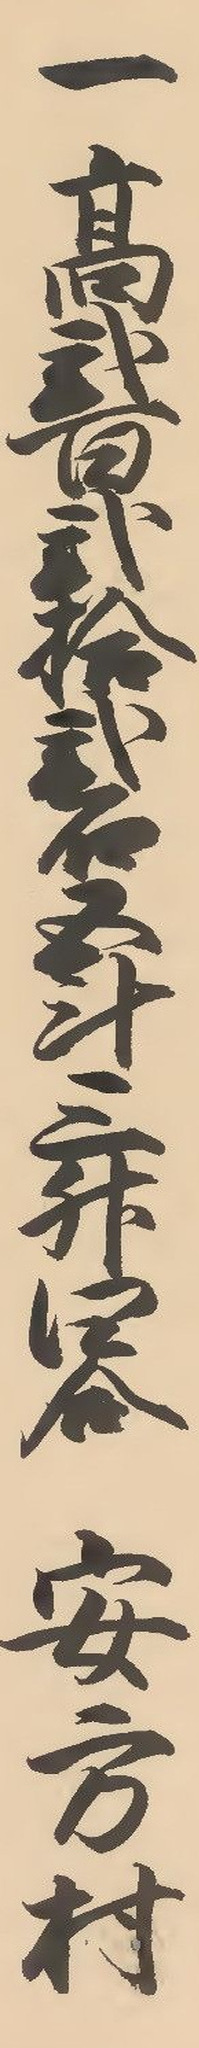一高弐百弐拾弐石五斗三升四合安方村
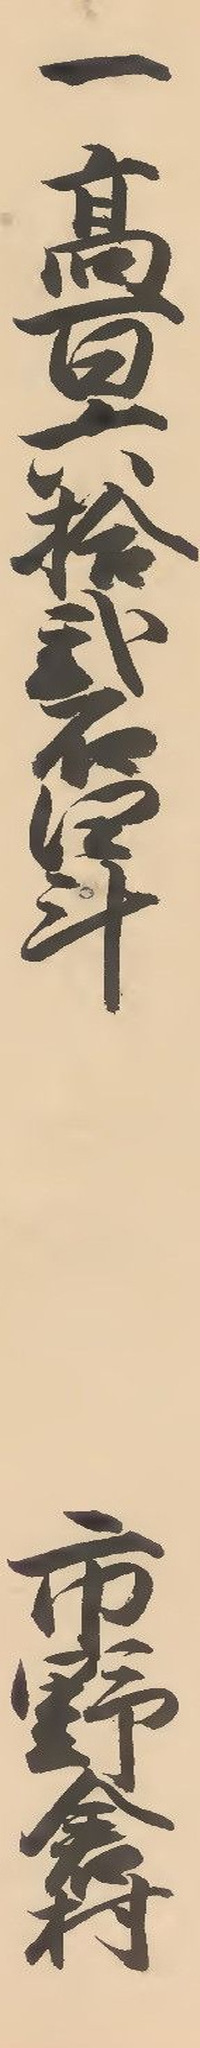一高百六拾弐石四斗市野倉村
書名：武蔵国郷帳　上
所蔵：国立公文書館 National Archives of Japan
